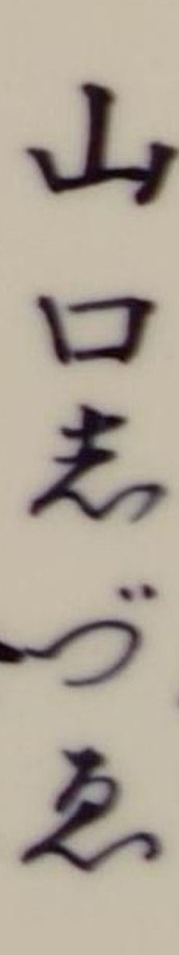山口しづゑ
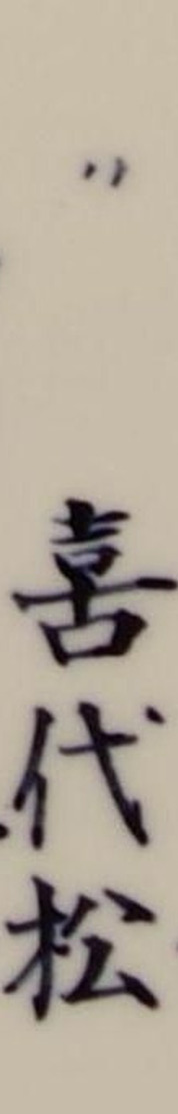喜代松
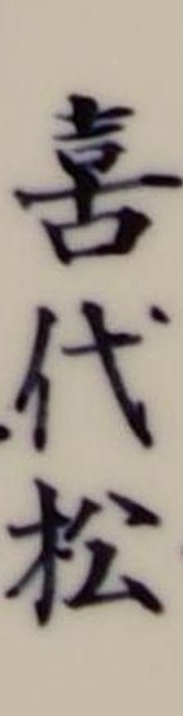喜代松
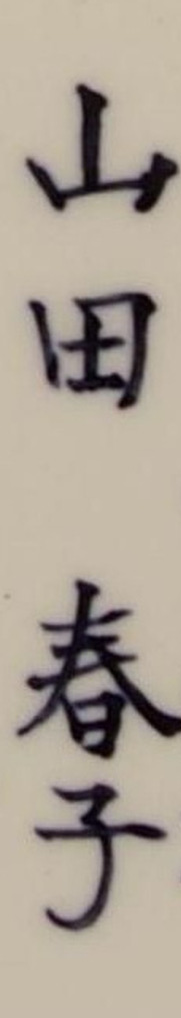山田春子
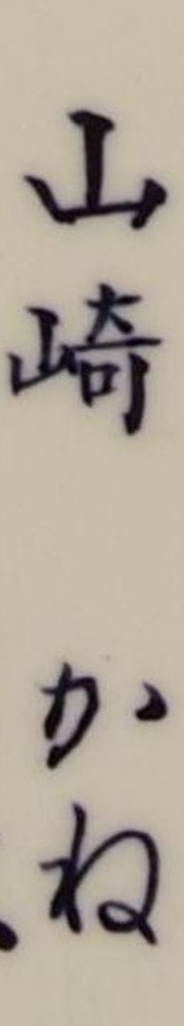山崎かね
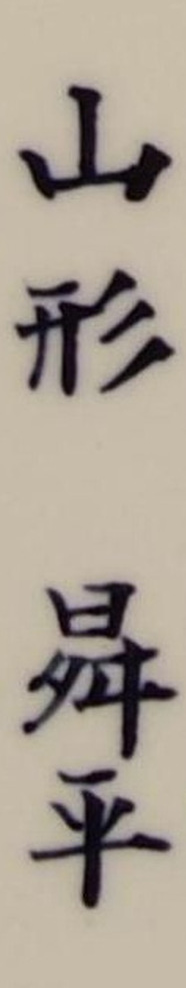山形昇平
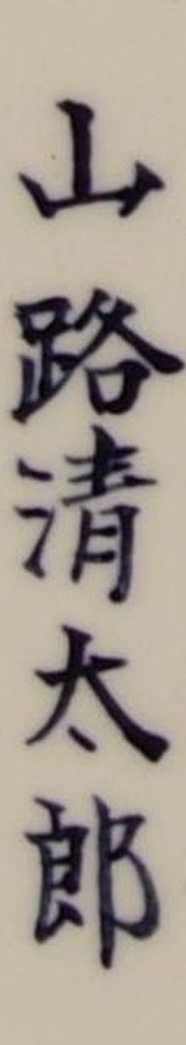山路清太郎
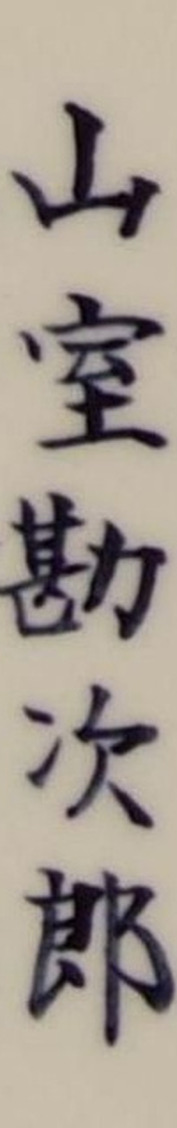山室勘次郎
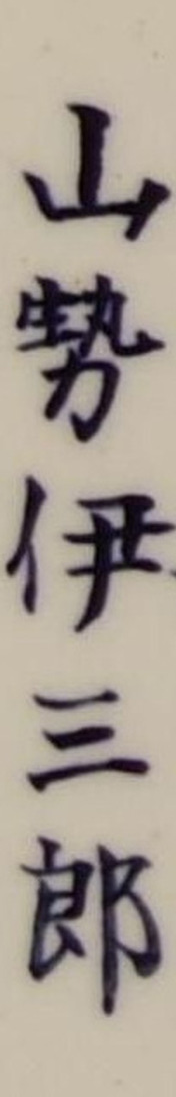山勢伊三郎
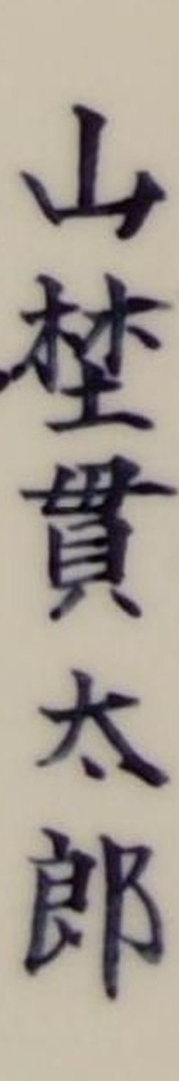山埜貫太郎
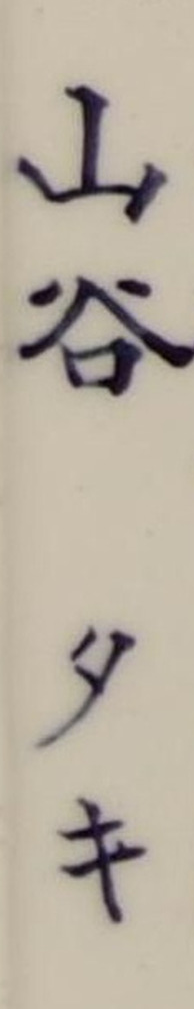山谷タキ

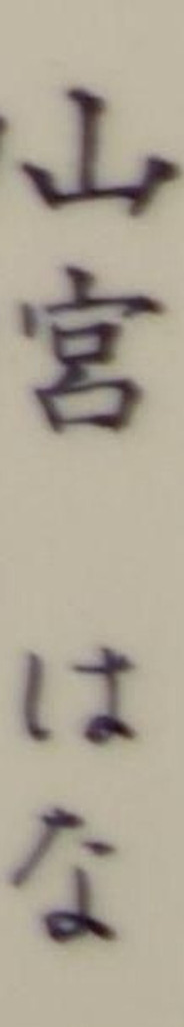山宮はな
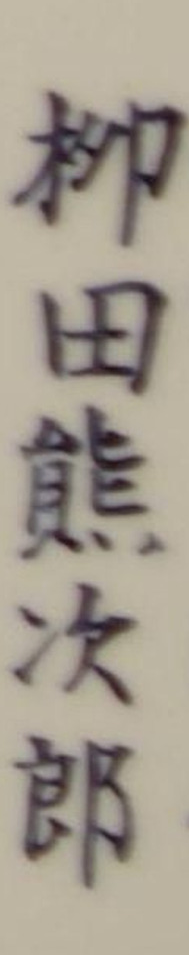柳田熊次郎
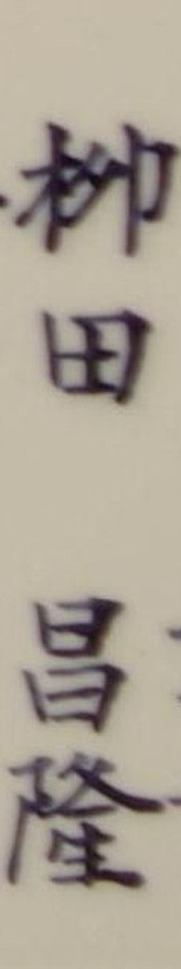柳田昌隆
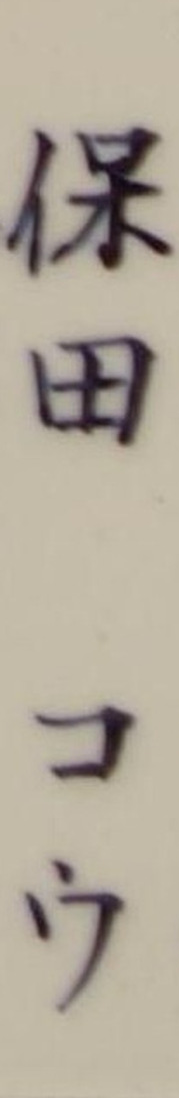保田コウ
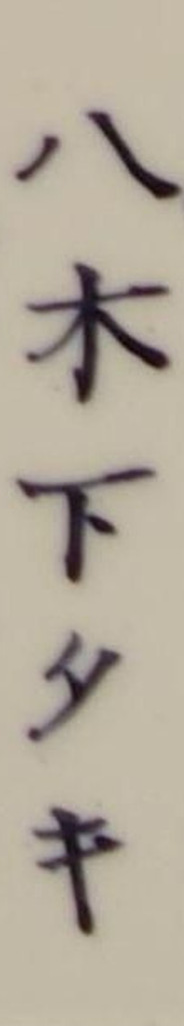八木下タキ
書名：M~S
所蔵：高野山金剛峯寺
